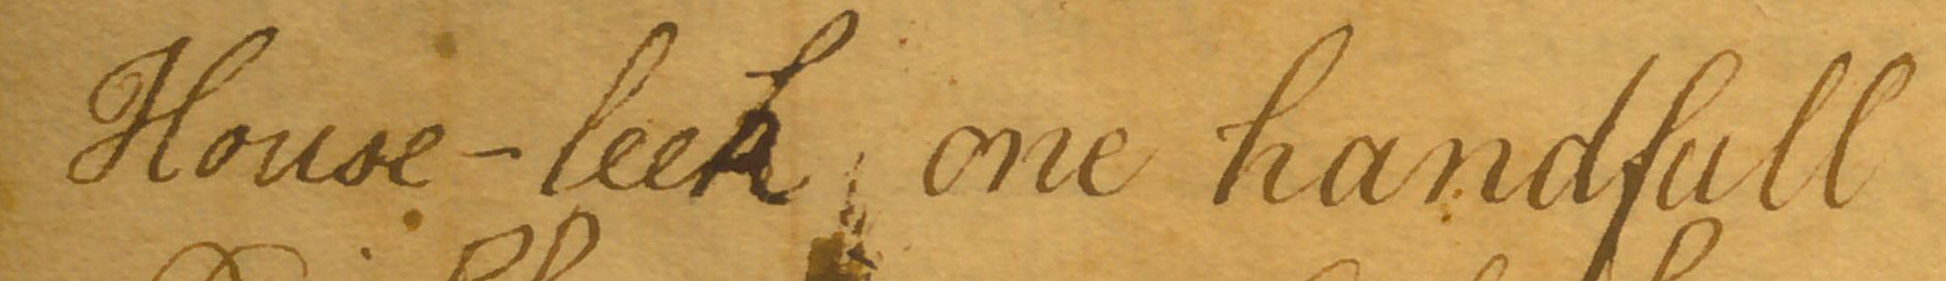House-leek one handfull
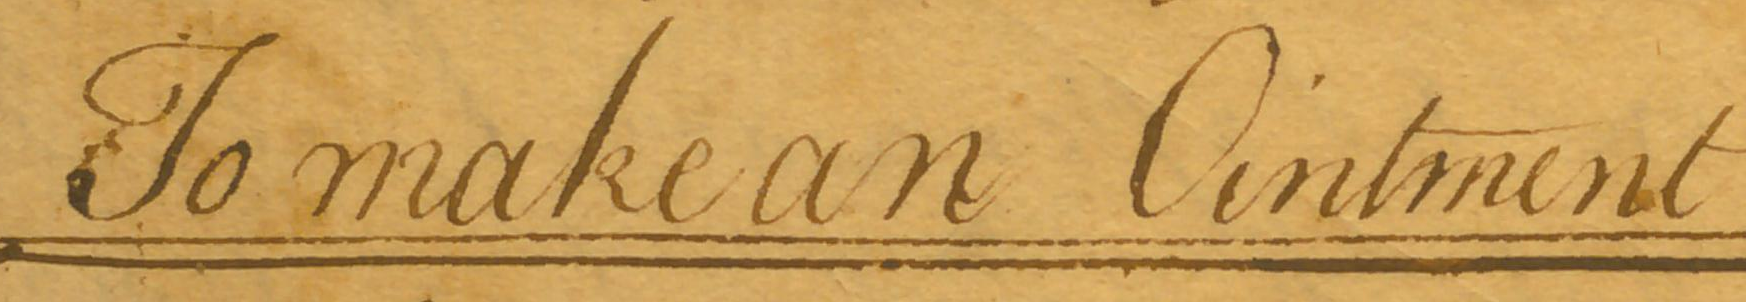To make an Ointment
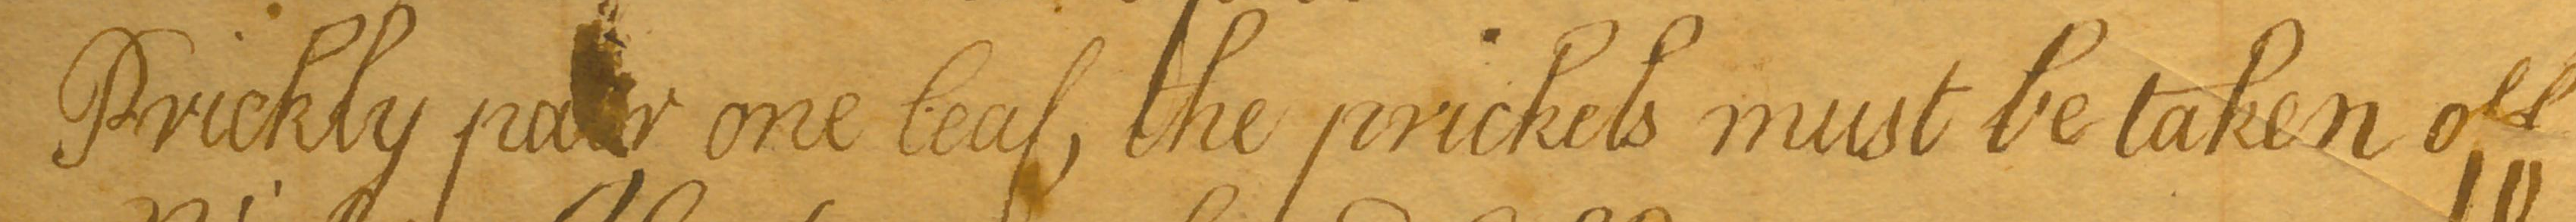Prickly pair one leaf, the prickels must be taken off
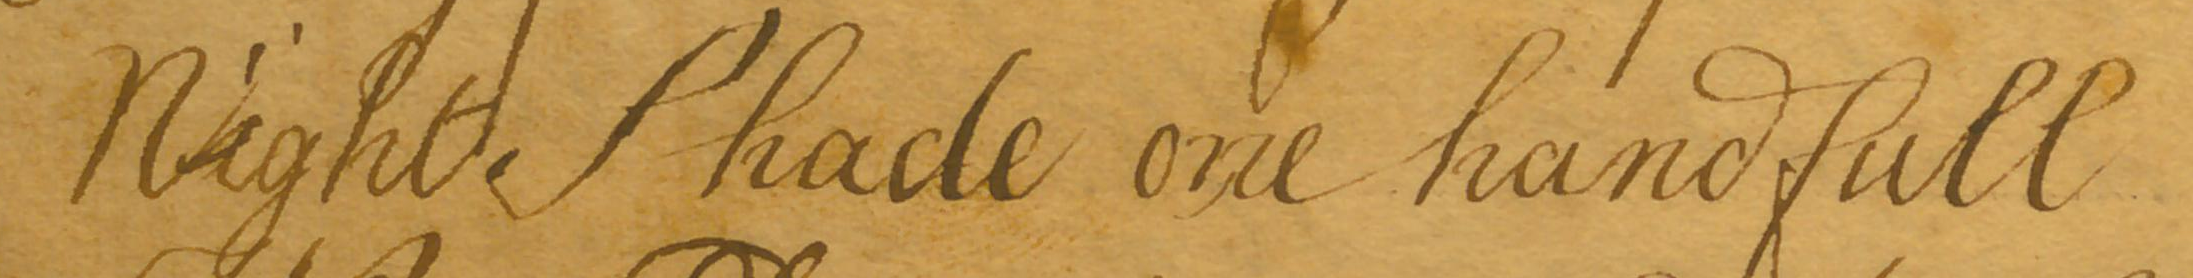Night Shade one handfull
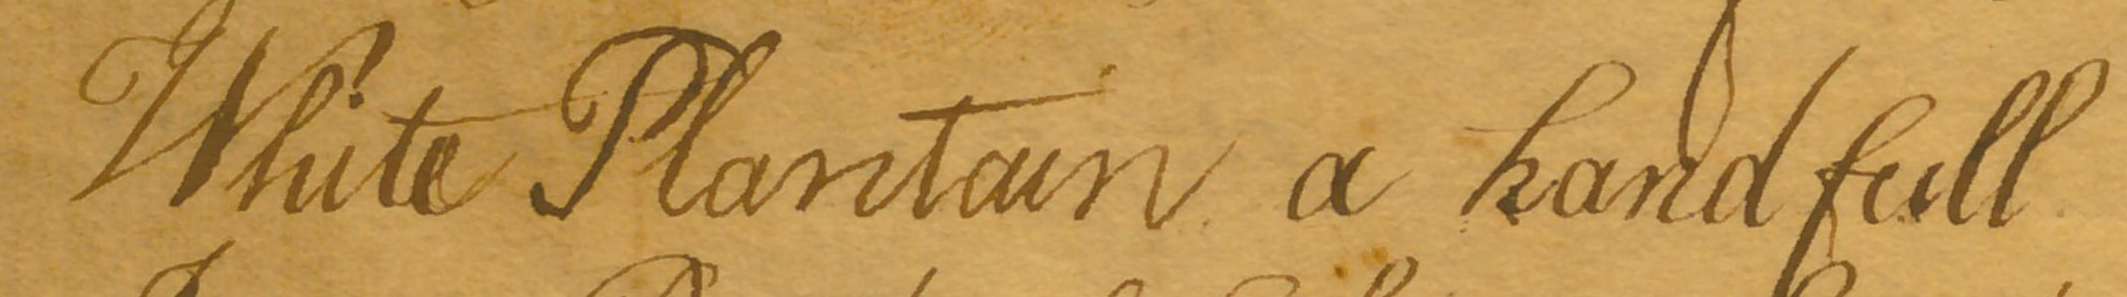White Plantain a handfull
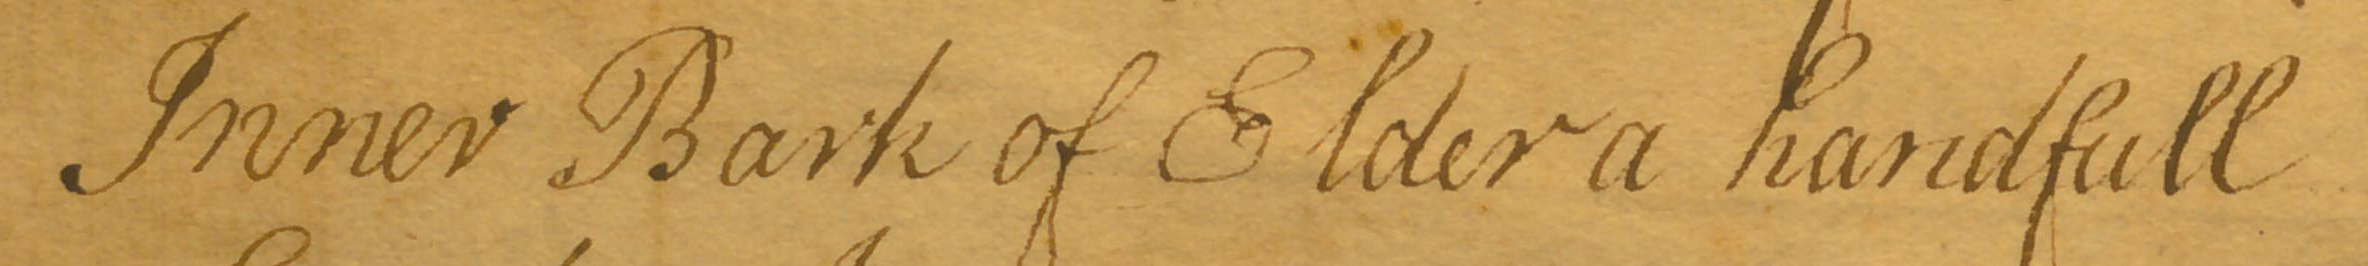Inner Bark of Elder a handfull
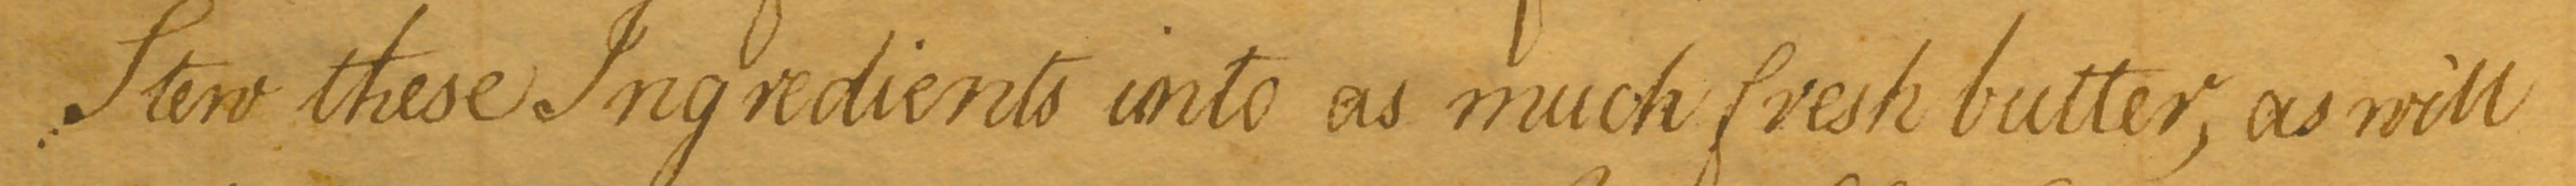Stew these Ingredients into as much fresh butter, as will
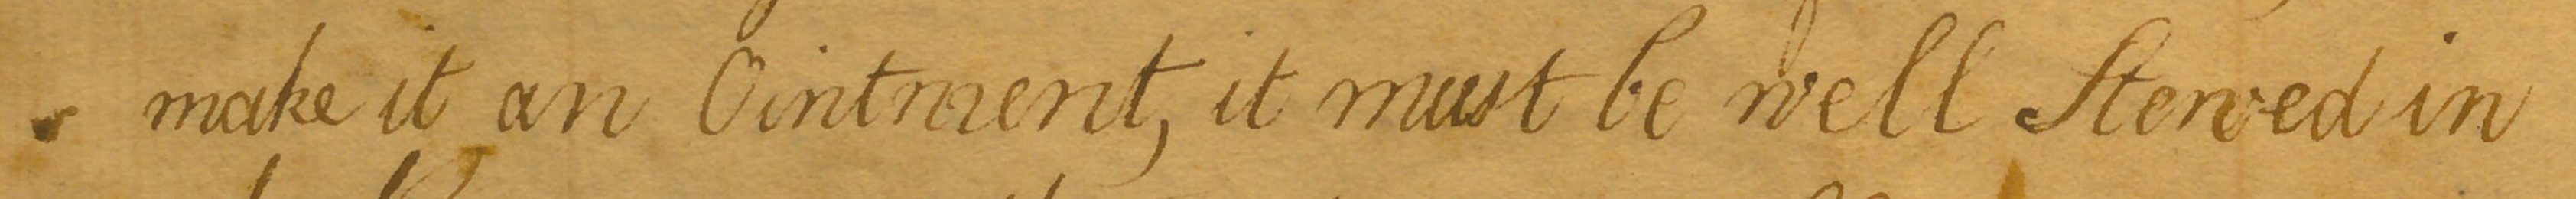make it an Ointment, it must be well stewed in
